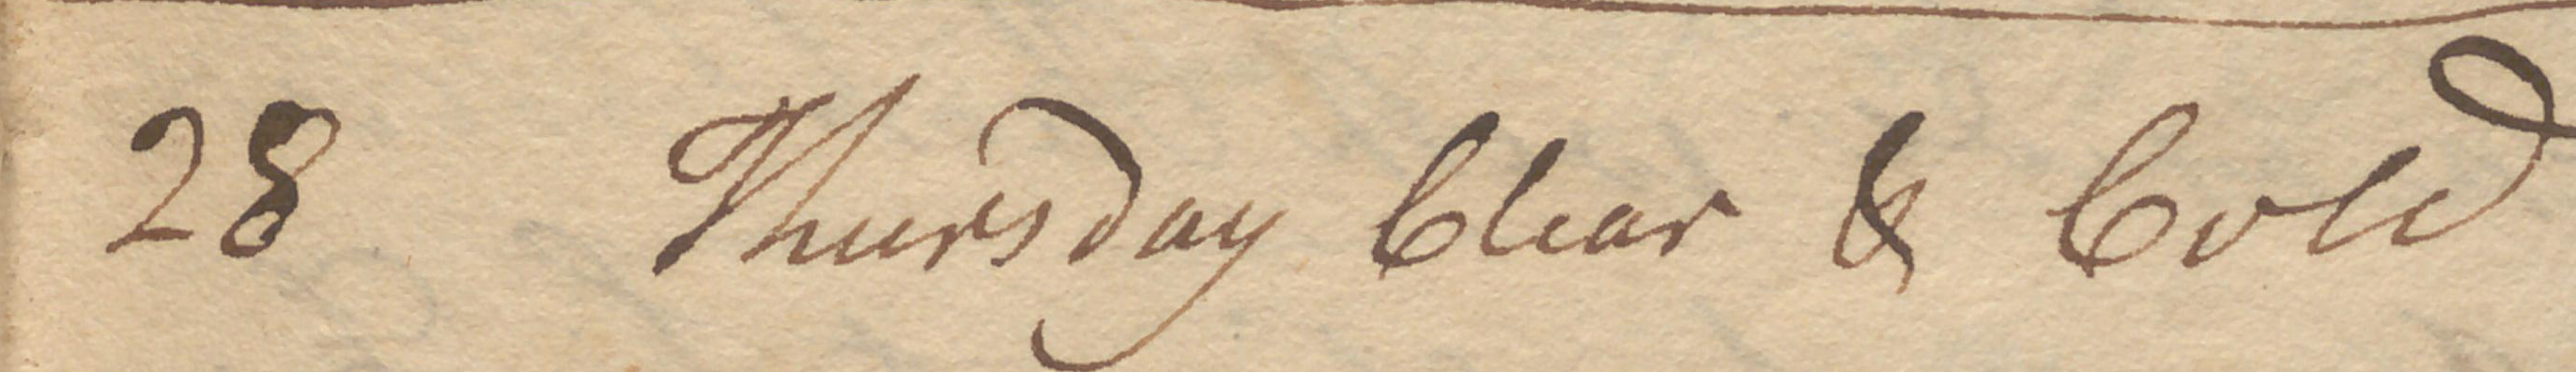28 Thursday Clear & Cold
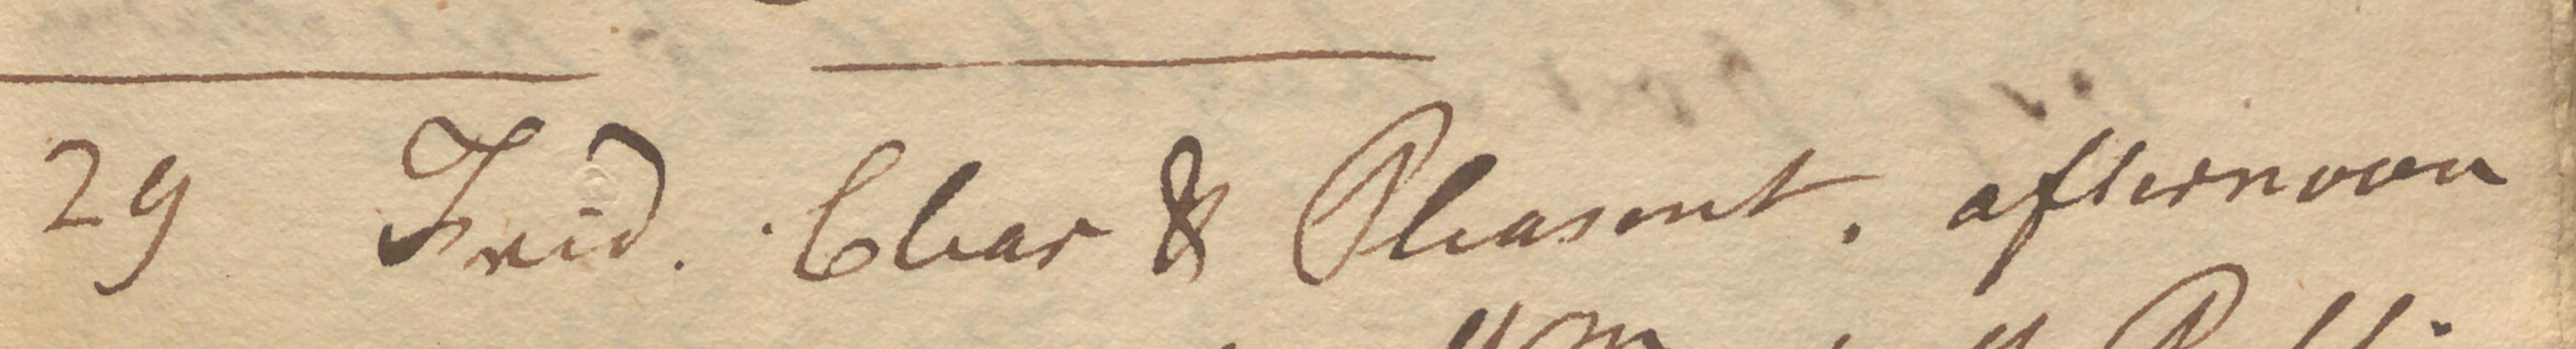29 Frid. Clear & Pleasent, afternoon
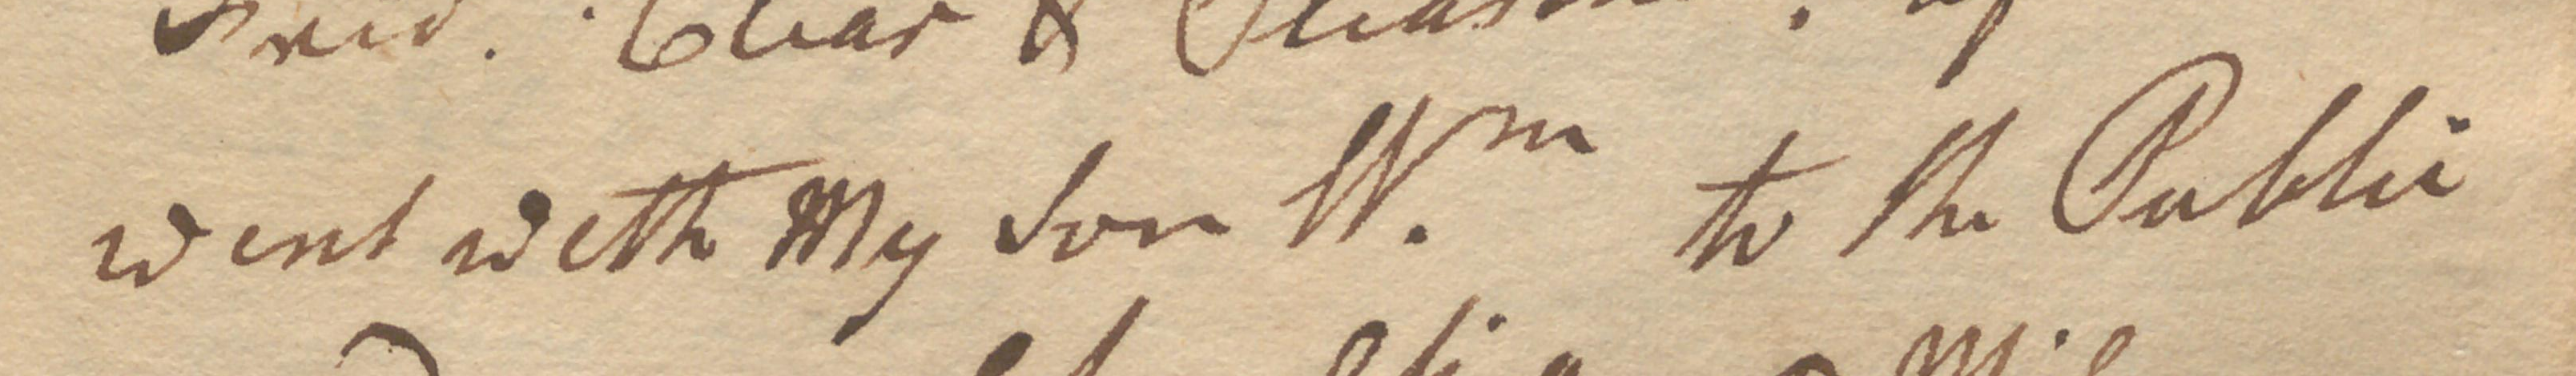went with My Son W^m. to the Public
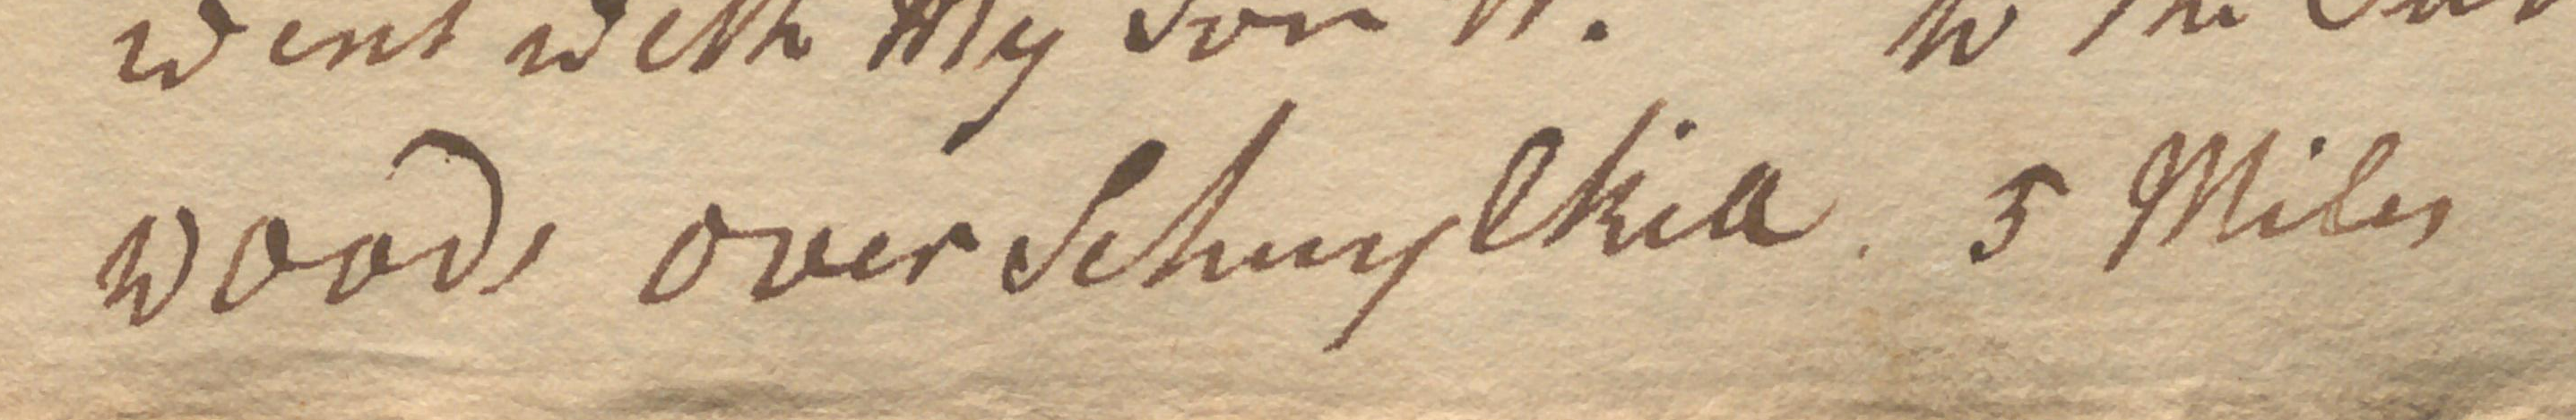woods over Schuylkill. 5 Miles
